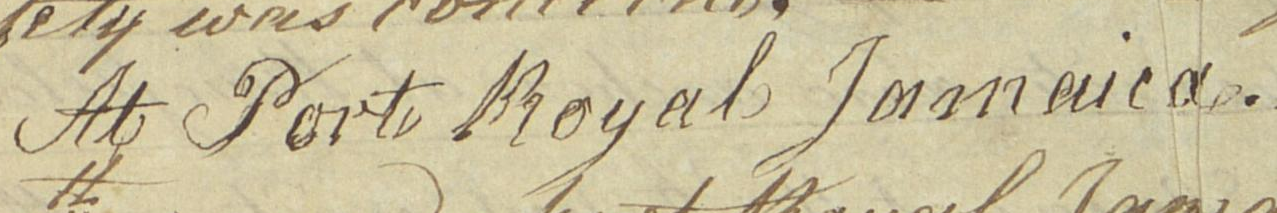At Port Royal Jamaica
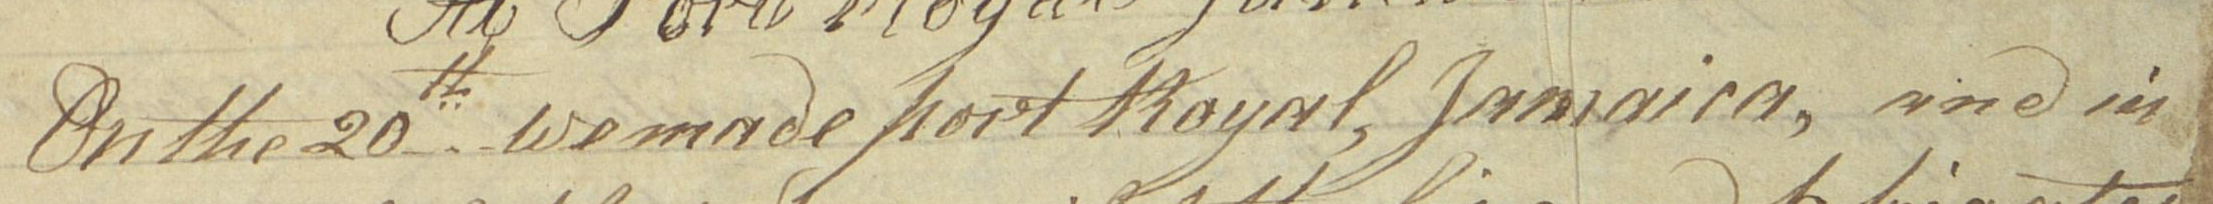On the 20^th. we made port Royal Jamaica, and in
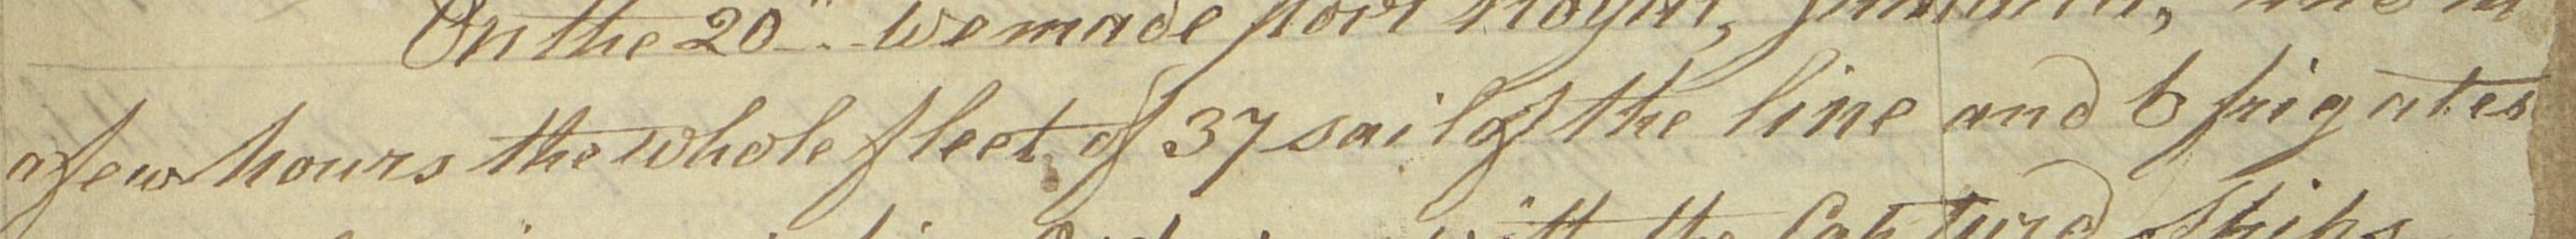a few hours the whole of fleet of 37 sail of the line and 6 frigates
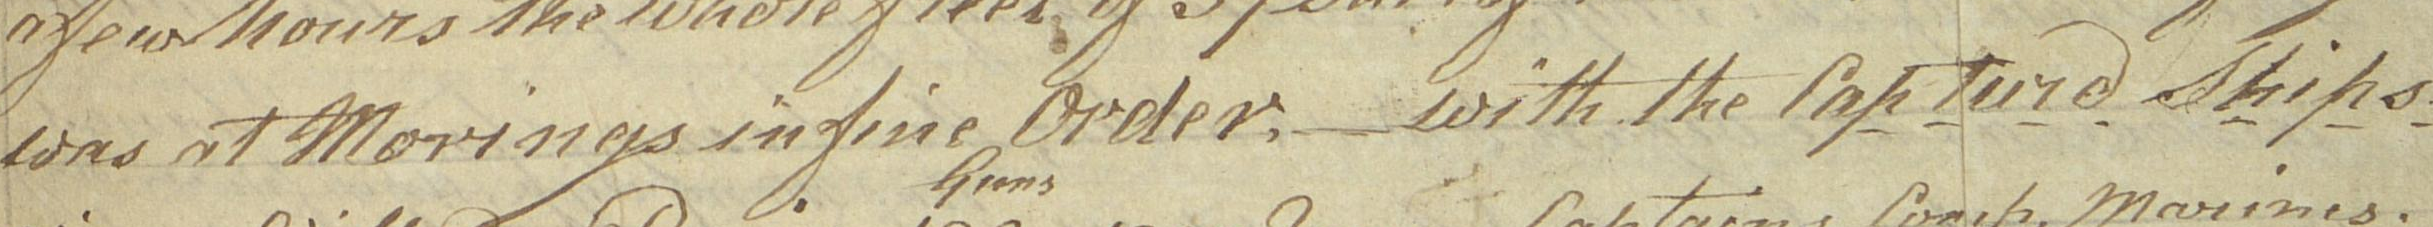was at Morings in fine order, with the Capturd Ships
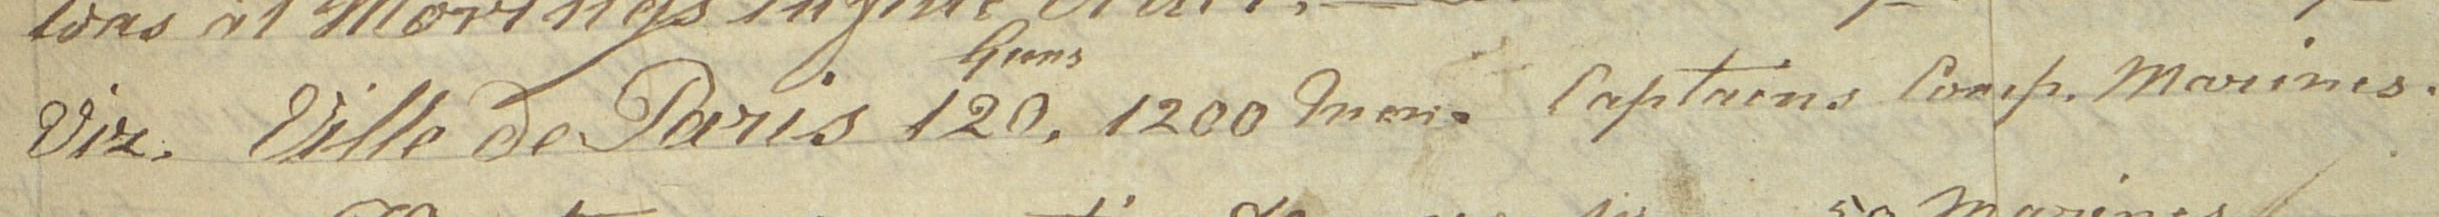Viz. Ville de Paris 120 ^, 1200 Inon. Captains Comp. Marines.
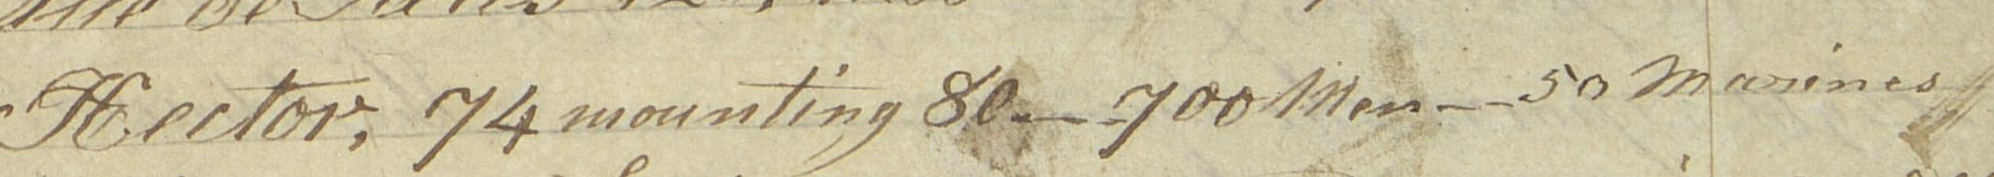Hector, 74 mounting 80, 700 Men, 50 Marines,
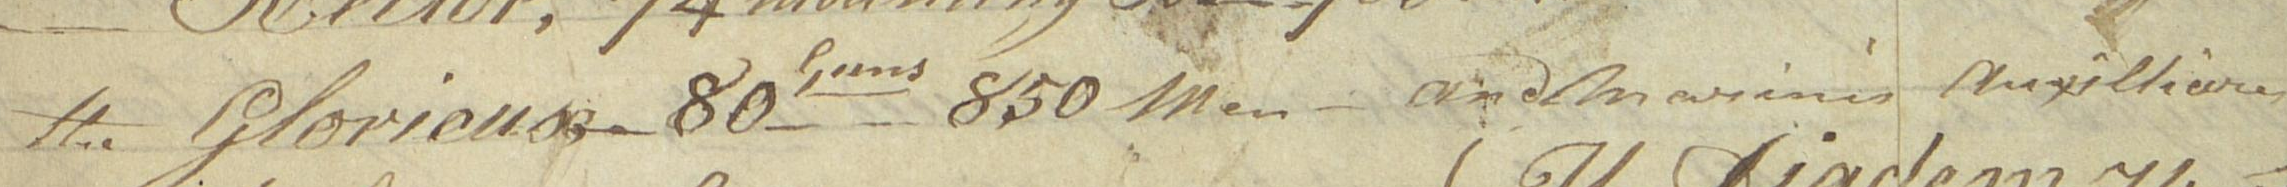the Glorious, 80^Guns, 850 Men, and Marines Auxilliary
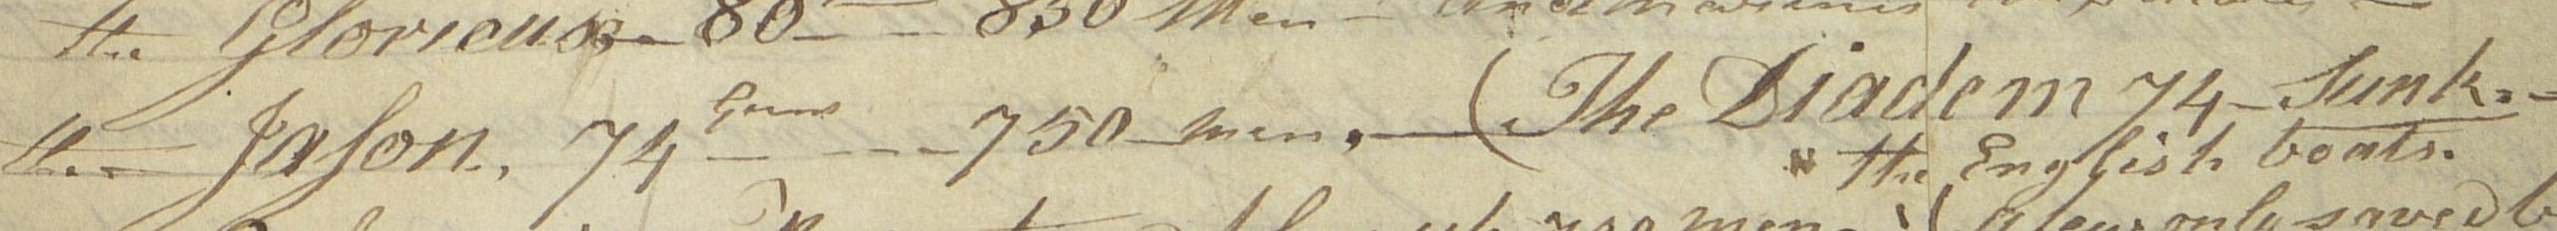II. Jason, 74^Guns, 750 men, (The Diadem 74 Sunk,
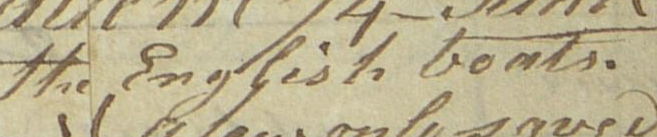the English boats.
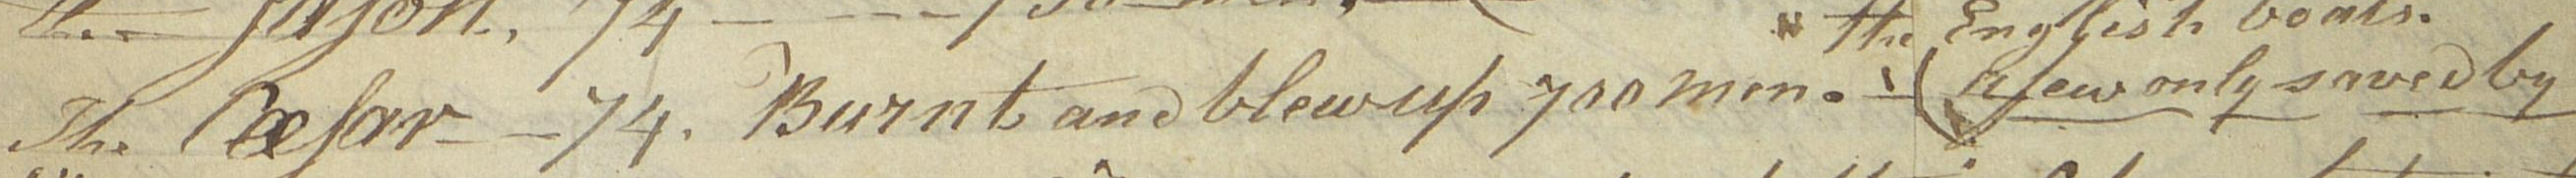The Caesar 74. Burnt and blew up 700 men. (a few only saved by
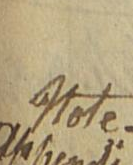Note
